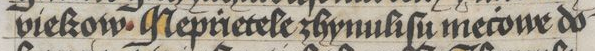viekow.Nepṙietele zhynuliſu meċowe do¬
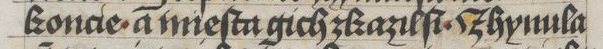koncie.a mieſta gich zkazil ſi.Zhynula
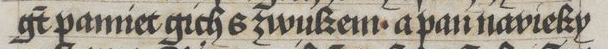ḡt pamiet gich s zwukem.a pan navieky
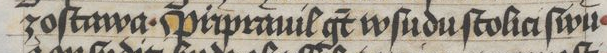zoſtawa.Pṙipravil ḡt w ſudu ſtolici ſwu.
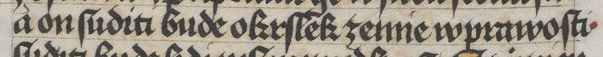a on ſuditi bude okrſlek zemie wprawoſti.
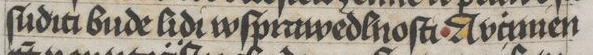ſuditi bude lidi wſprawedlnoſti.A uċinien
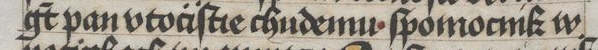ḡt pan utoċiẛtie chudemu.ſpomocník w
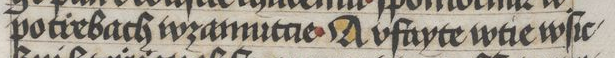potṙebach wzarmutcie.A ufayte wtie wẛie¬
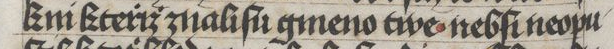kni kteṙiż znaliſu gmeno twe.nebſi neopu¬
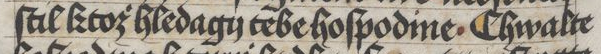ſtil ktož hledagij tebe hoſpodine.Chwalte
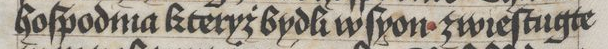hoſpodina kteryż bydli w ſyon.zwieſtugte
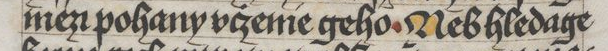mezi pohany ucżenie geho.Neb hledage
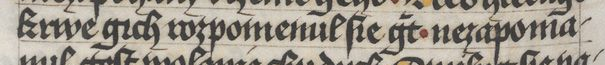krwe gich rozpomenul ſie ḡt.nezapoma¬
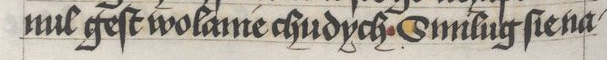nul geſt wolanie chudych.Smilug ſie na¬
